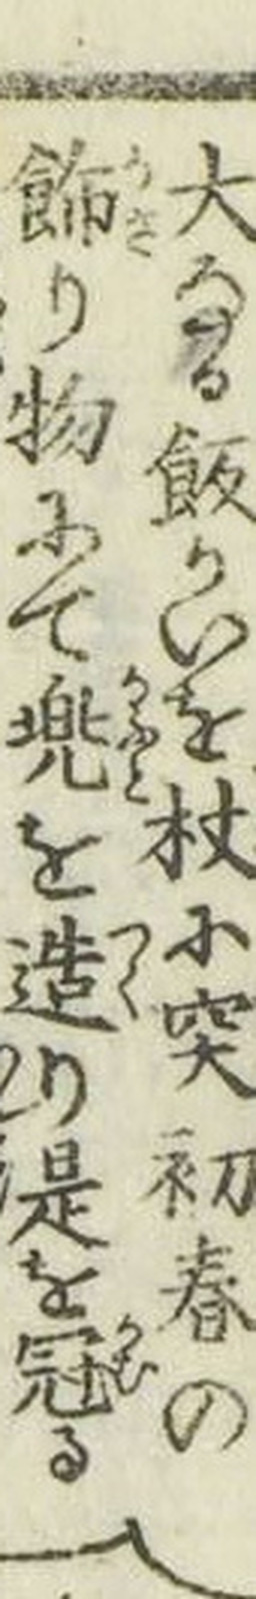飾り物にて兜を造り是を冠る
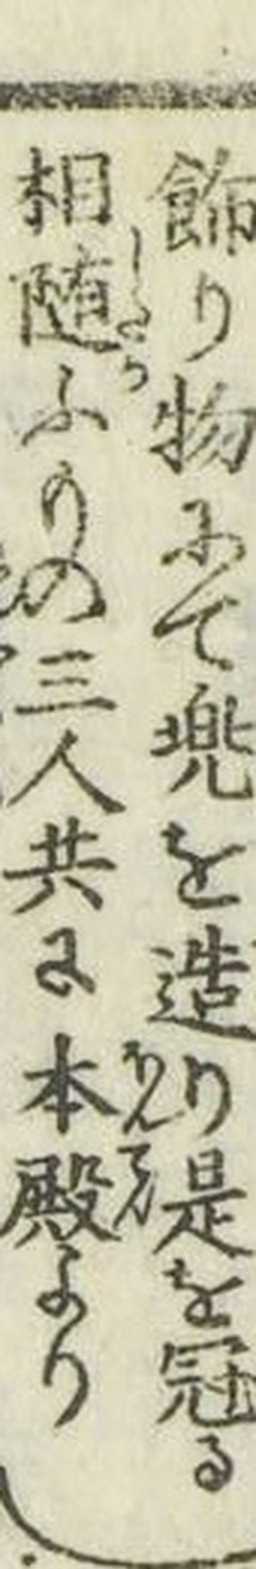相随ふもの三人共に本殿より
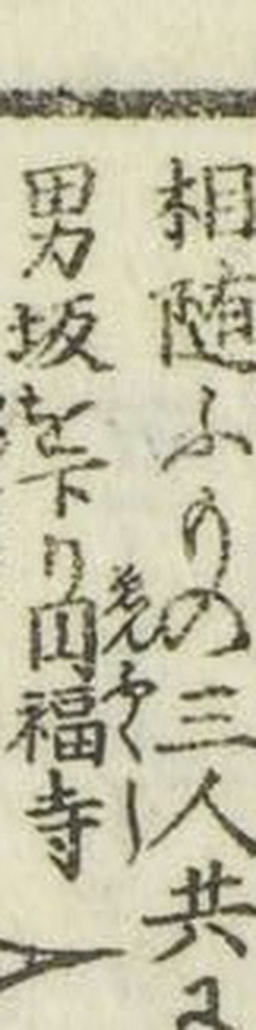男坂を下り円福寺
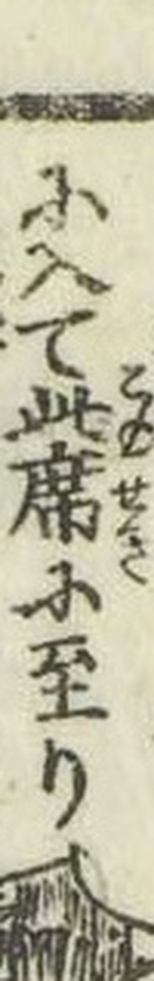に入て此席に至り
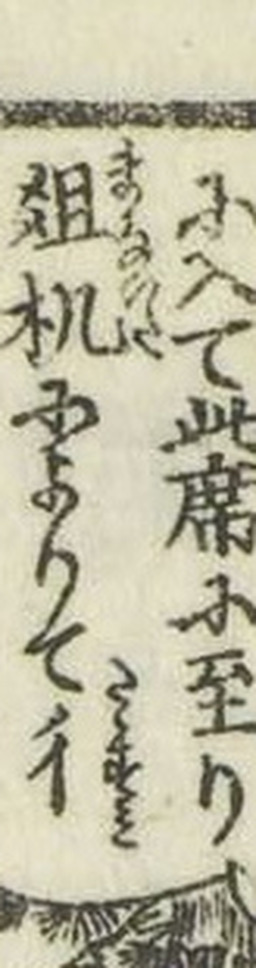俎机によりて彳
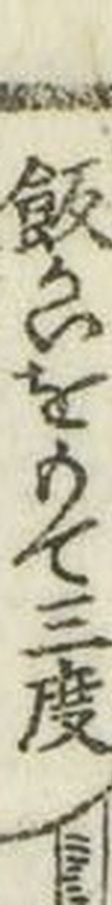飯かいをもて三度
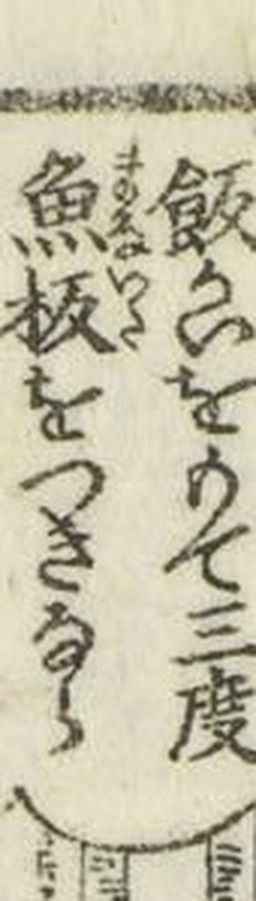魚板をつきなら
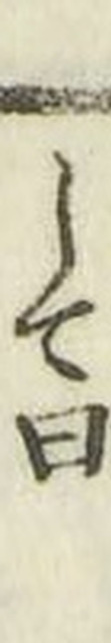して曰
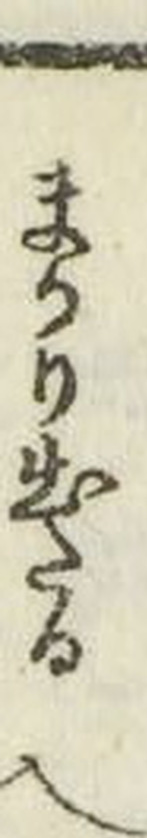まかり出たる
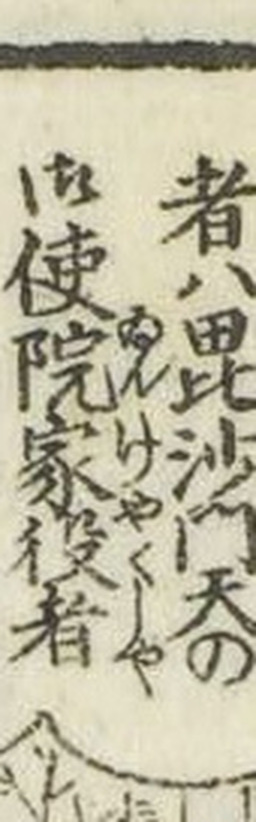御使院家役者
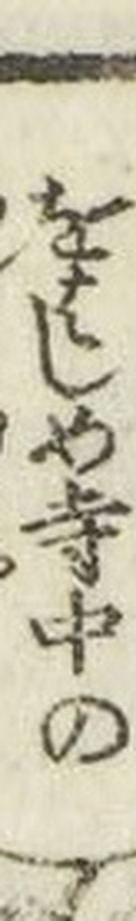をはしめ寺中の
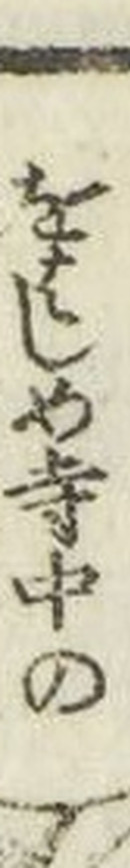をはしめ寺中の
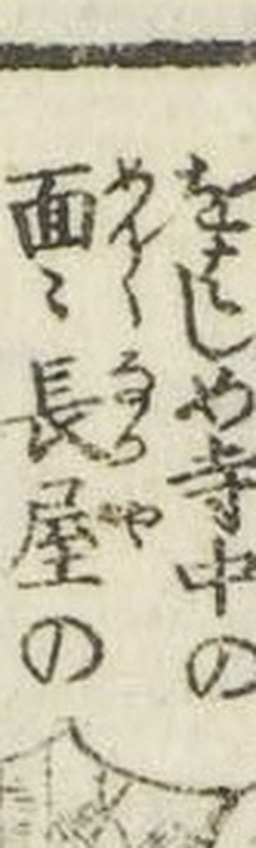面々長屋の
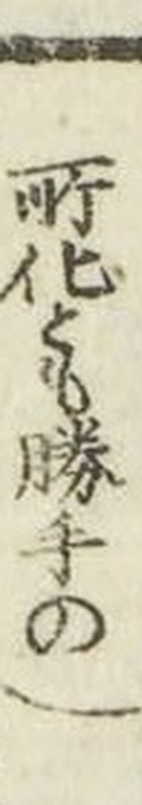所化とも勝手の
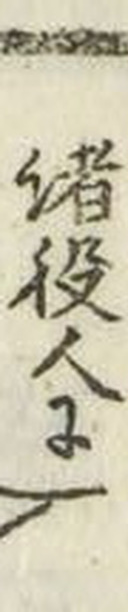諸役人に
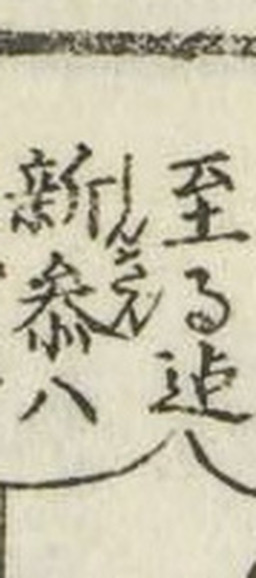新参は
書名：江戸名所図会 20巻 巻之3
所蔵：東京学芸大学教育コンテンツアーカイブ
